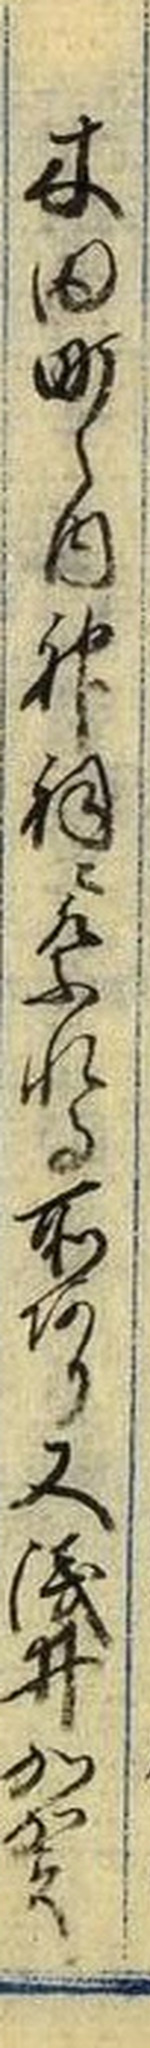木田町之内神祠に祭れる所あり又浅井加賀

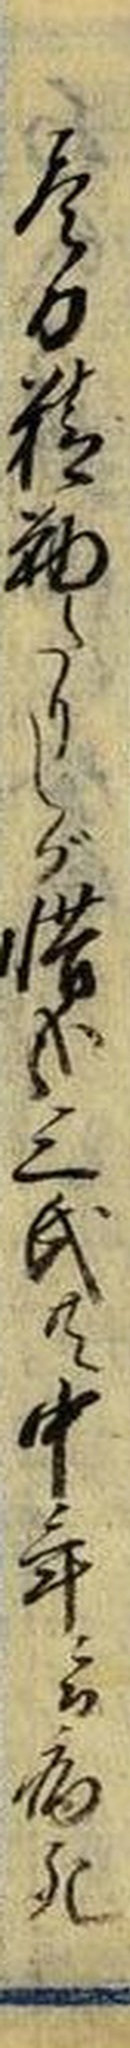尽力精勤たりしが惜哉三氏共中年に而病死
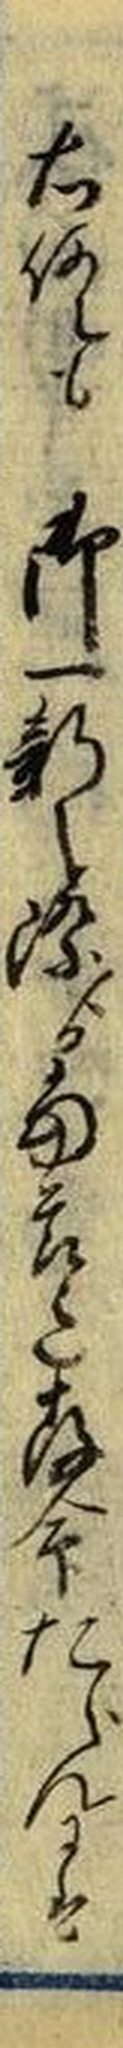右何れも御一新之際ゟ当節迄存命たらんには
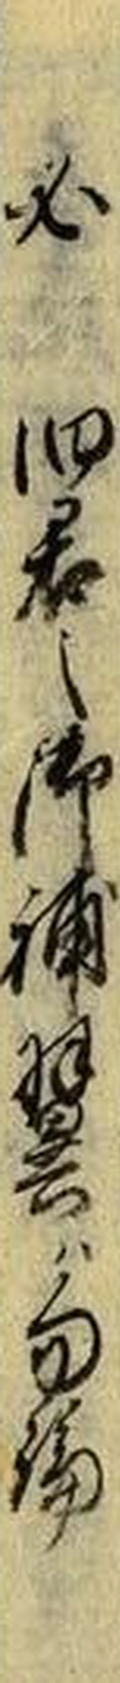必旧君之御補翼は勿論
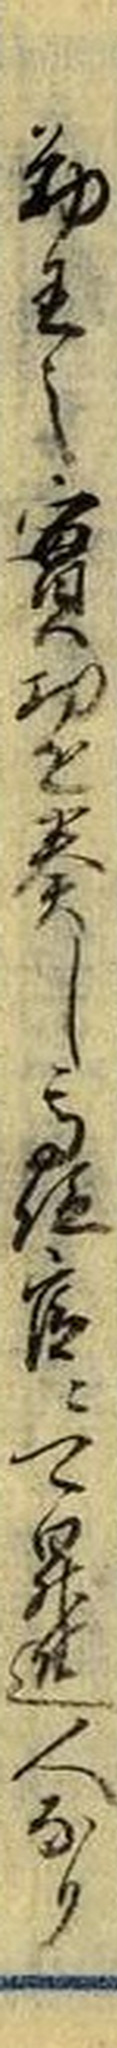勤王之実功を奏し高位官に可昇進人なり
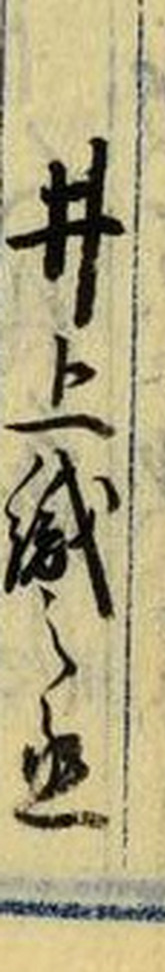井上織之丞
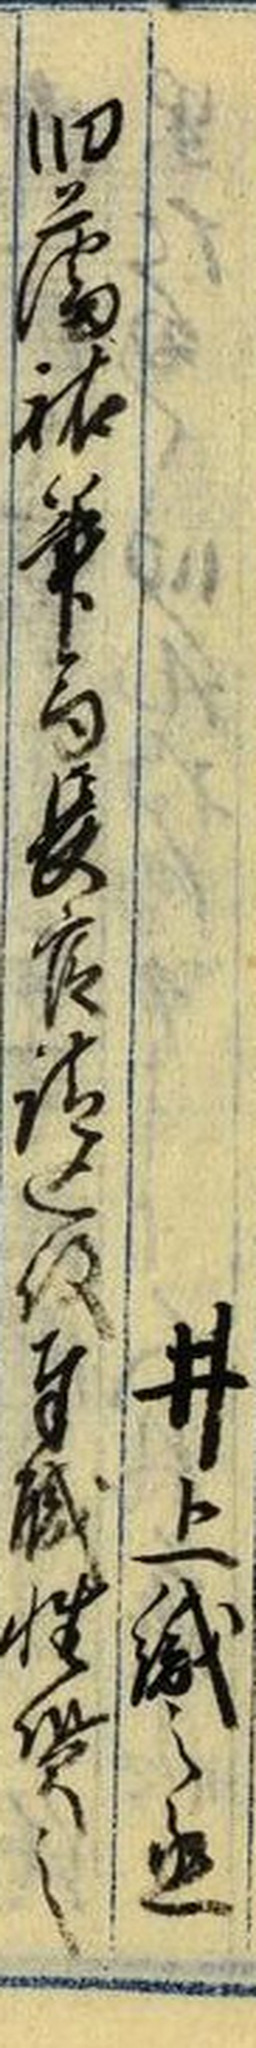旧藩祐筆局長官請込役奉職性質之
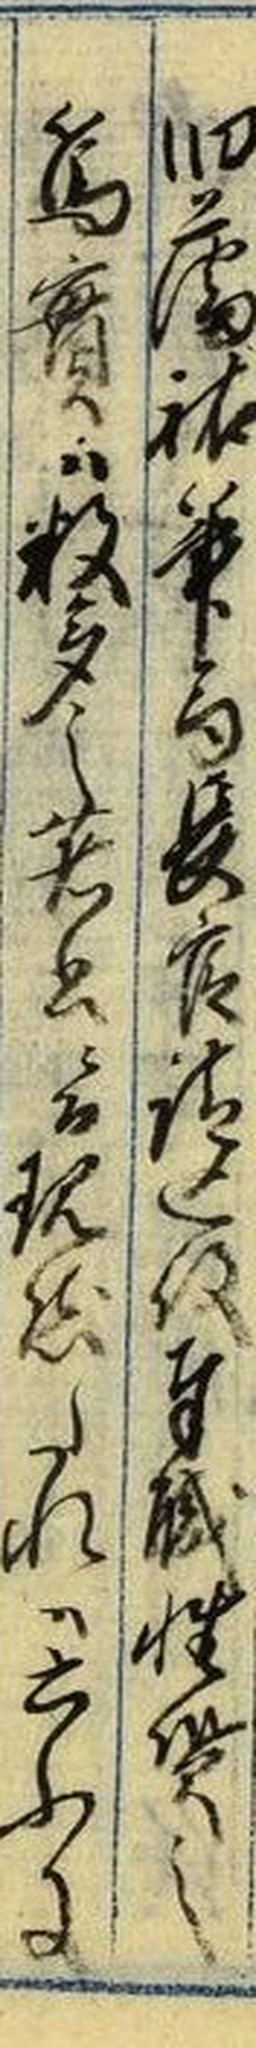篤実は数多之著書に而現然たれは云ふに
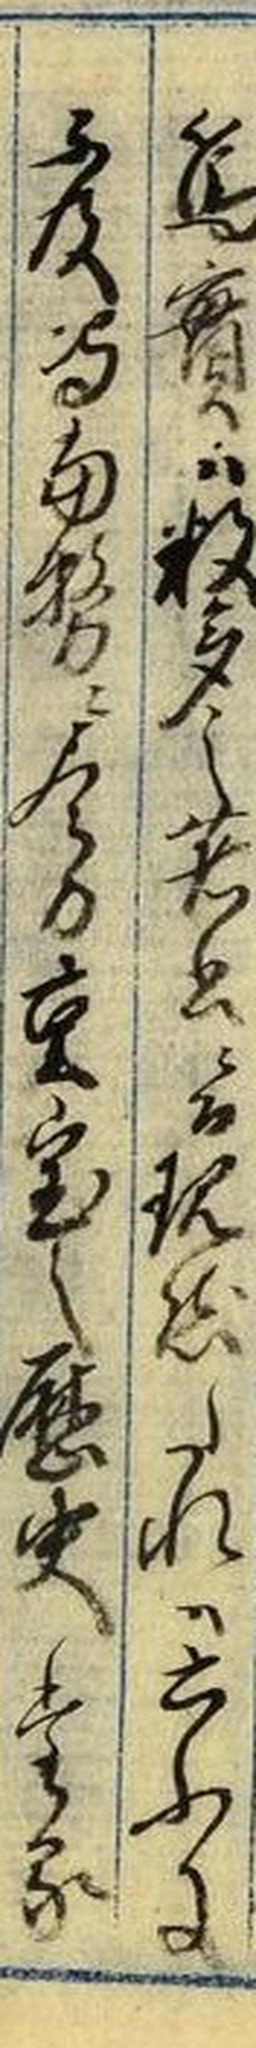不及専当務に尽力重宝之歴史たる
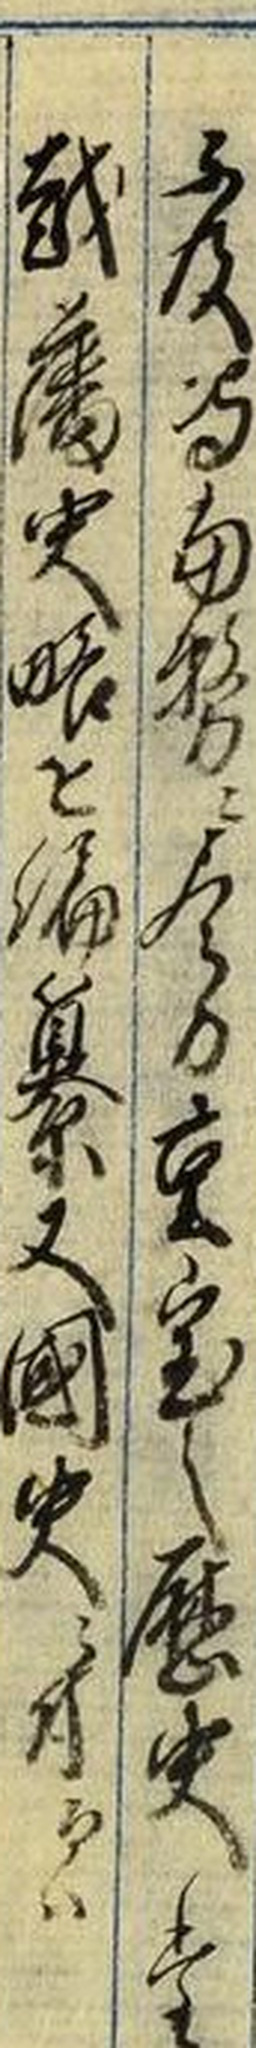越藩史略を編纂又国史に付而は
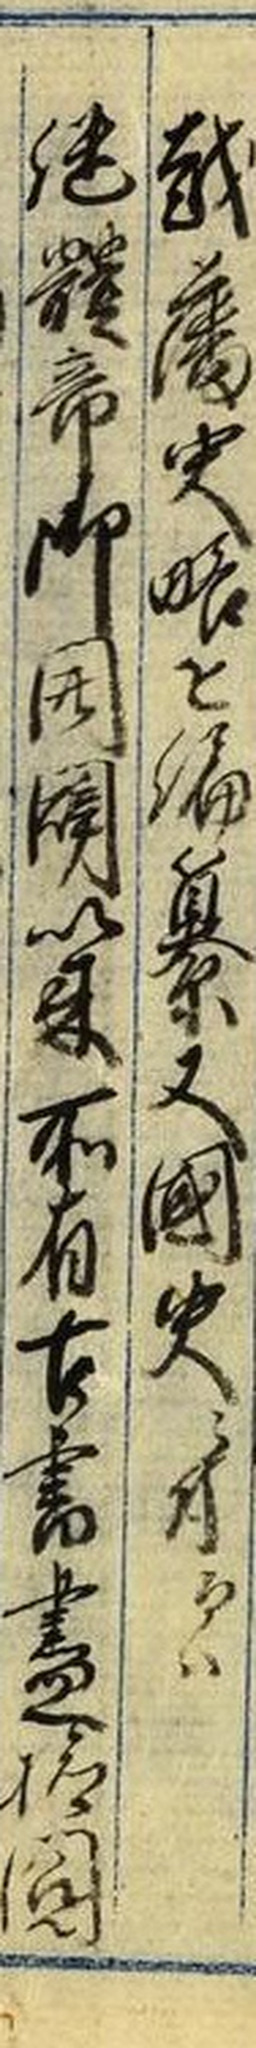継体帝御開闢以来所有古書盡検閲
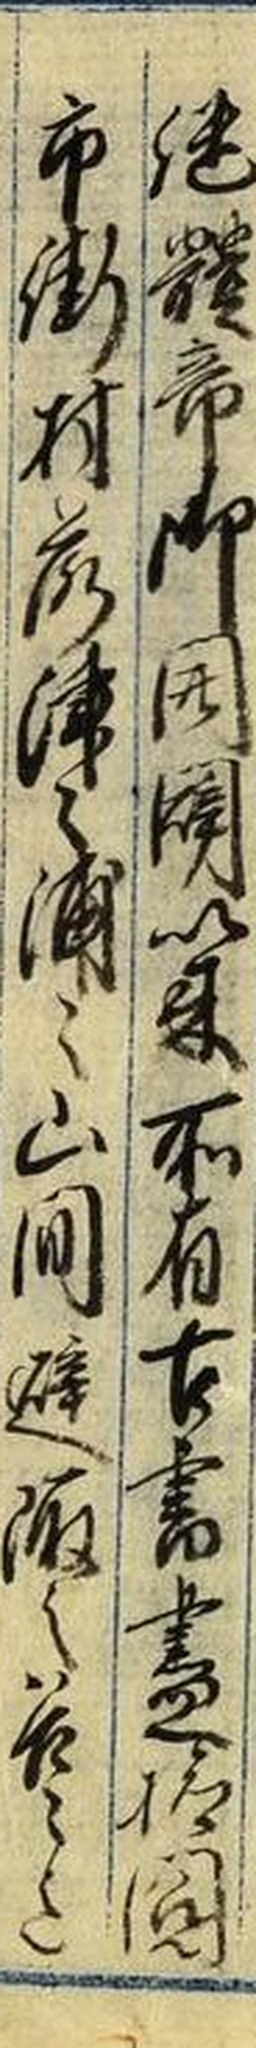市街村落津々浦々山間僻陬之谷々迄
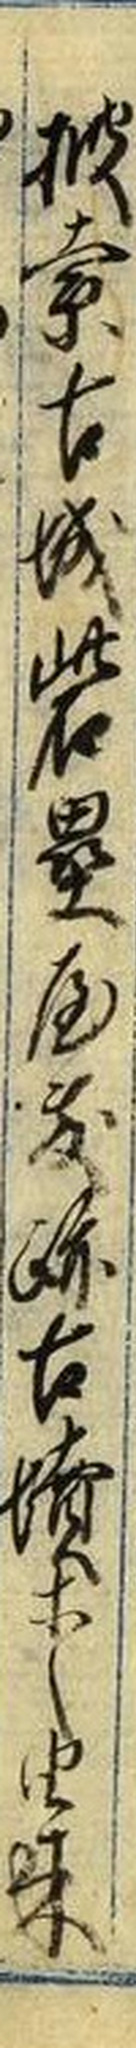披索古城砦塁屋敷跡古墳等之由来
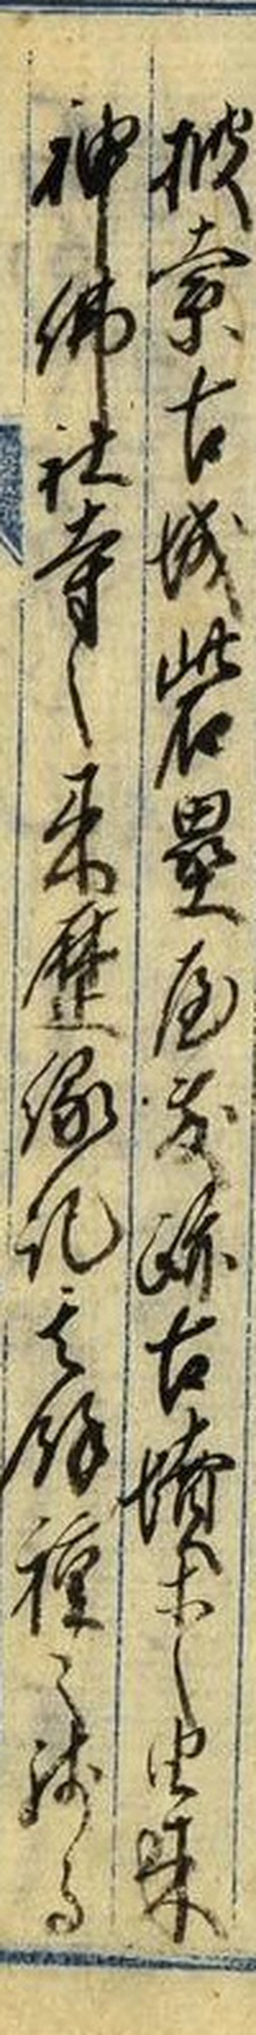神仏社寺之来歴縁起其余種々残る

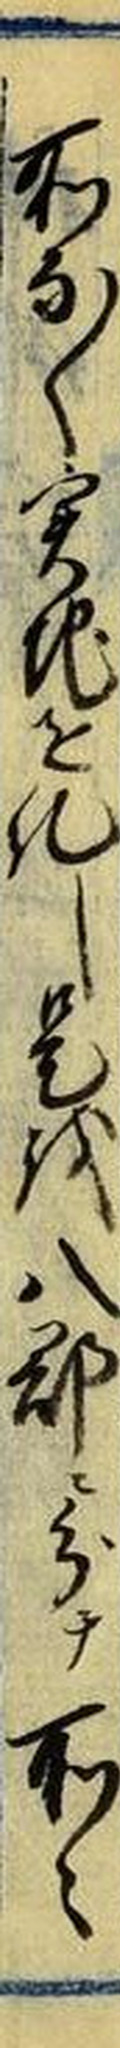所なく実地を糺し是を八郡に分ち所々
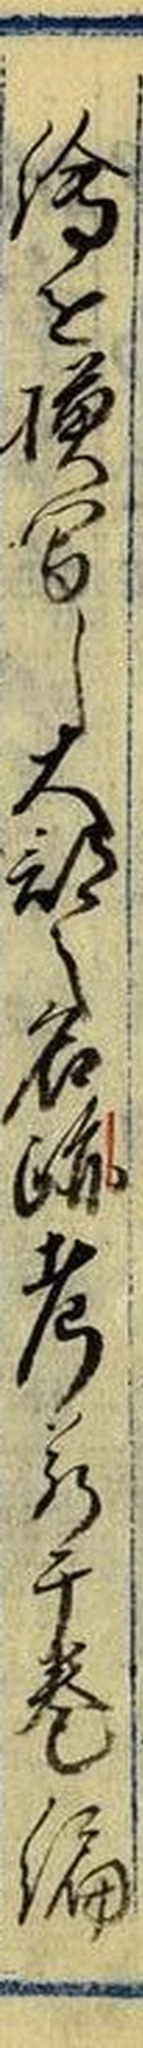絵を模写し大部之名跡考若干巻編
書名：温古集 四巻
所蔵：福井県文書館 Fukui Prefectural Archives
